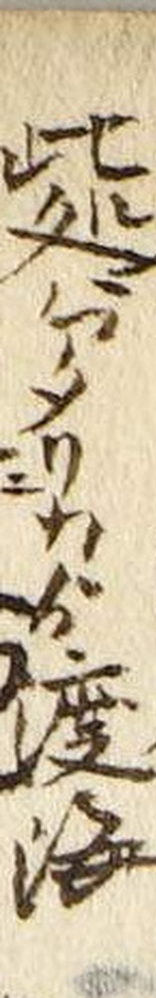此処ハアメリカゟ渡海
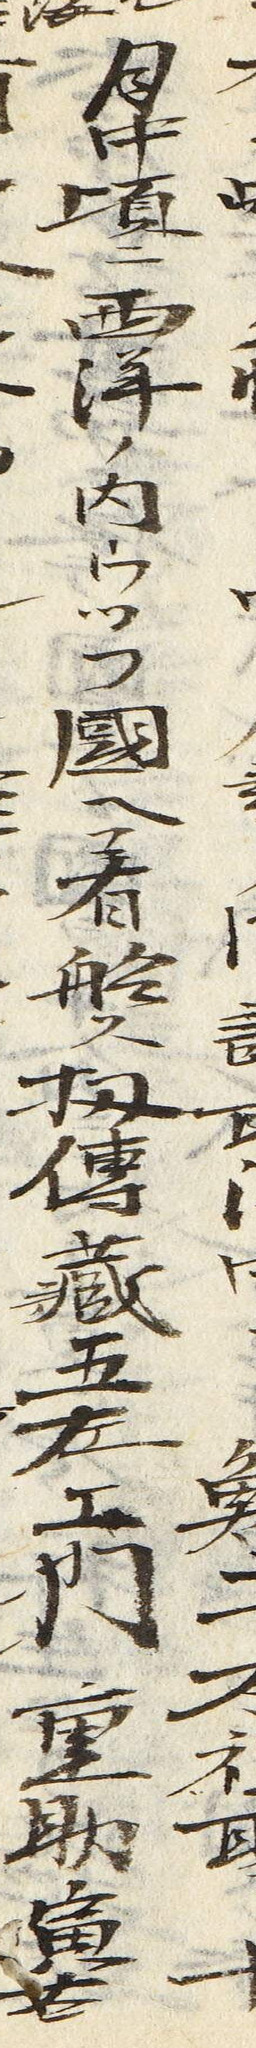月中頃ニ西洋ノ内ウツフ国ヘ着舩ス扨傳蔵五左衛門重助寅右
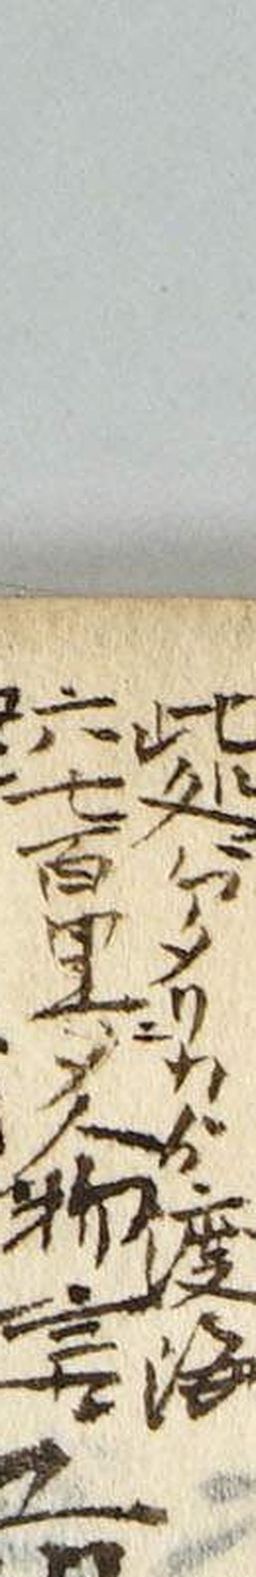六七百里ニ〆人物言
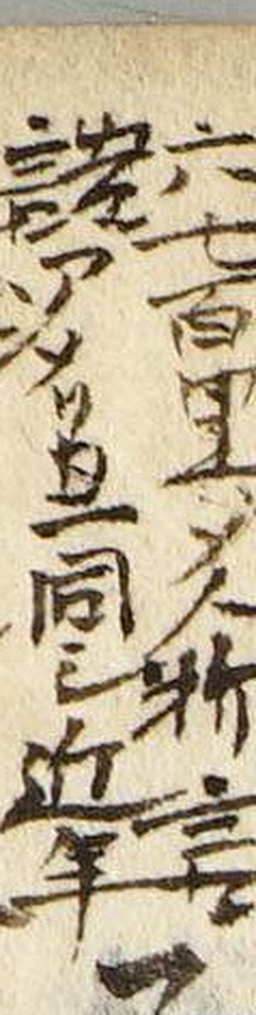語アメリカニ同シ近年
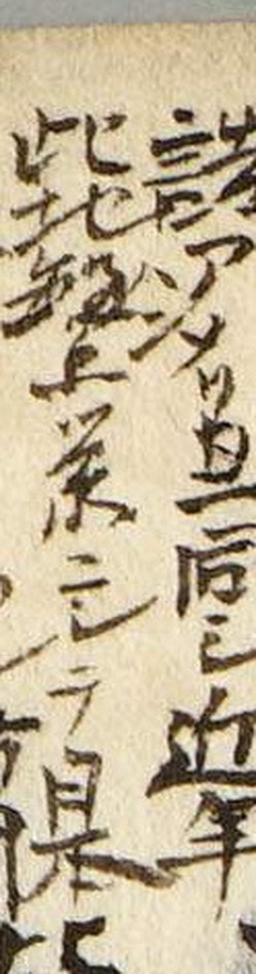此地繫栄ニシテ日本
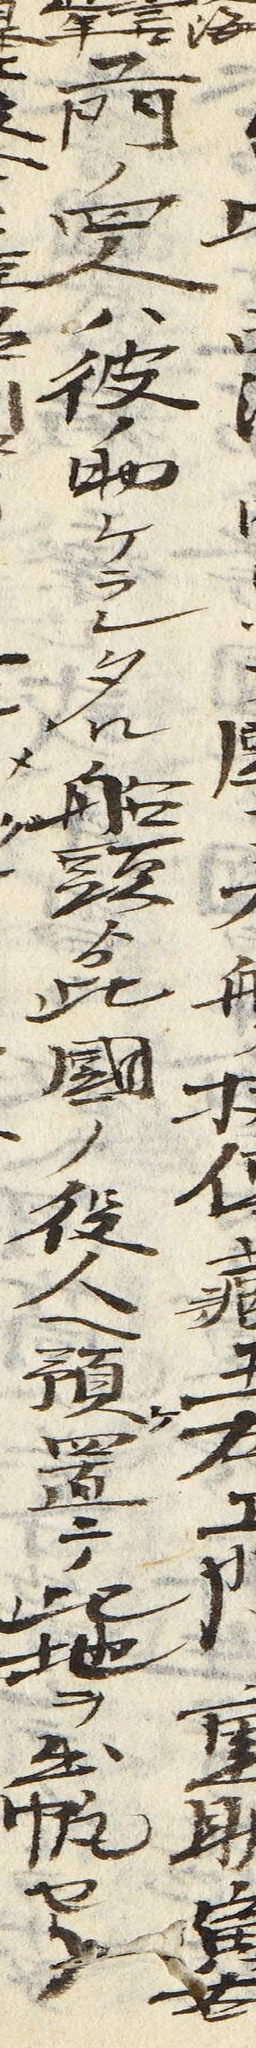衛門ノ四人ハ彼ノ助ケラㇾタル船頭ゟ此国ノ役人ヘ預ケ置テ此地ヲ出帆セリ
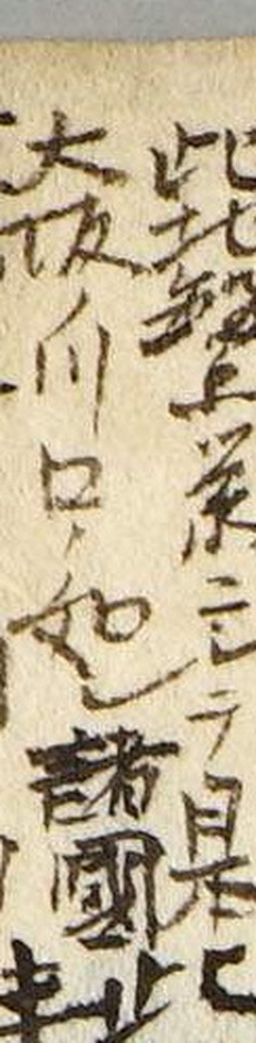大坂ノ川口ノ如シ諸国
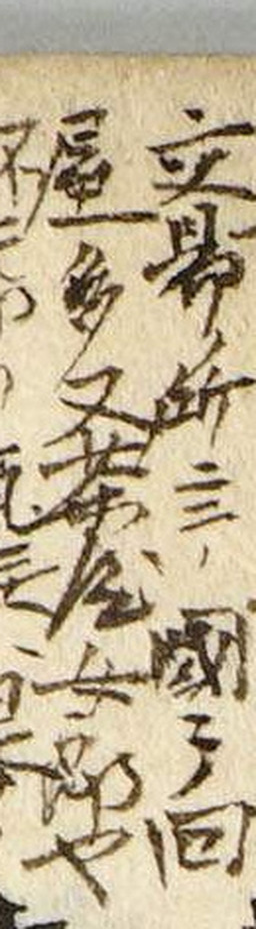屋多又茶屋女郎ヤ
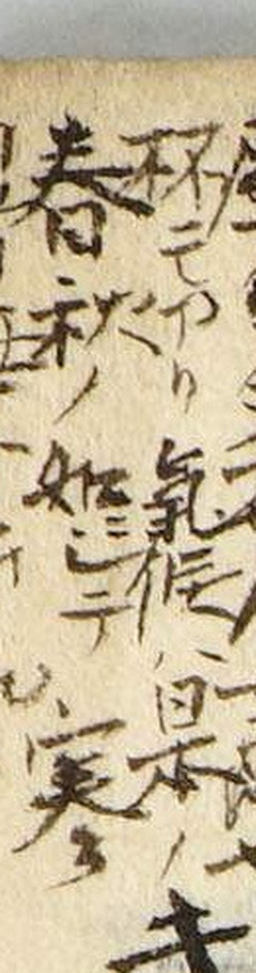春秋ノ如ニシテ実
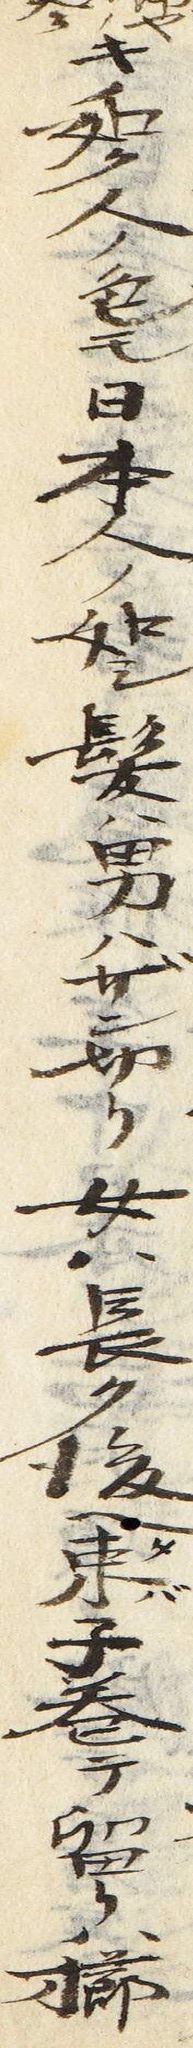キノ如ク人ノ色モ日本人ノ如シ髪ハ男ハザン切リ女ハ長ク後ヘ束ネ巻テ留リハ櫛

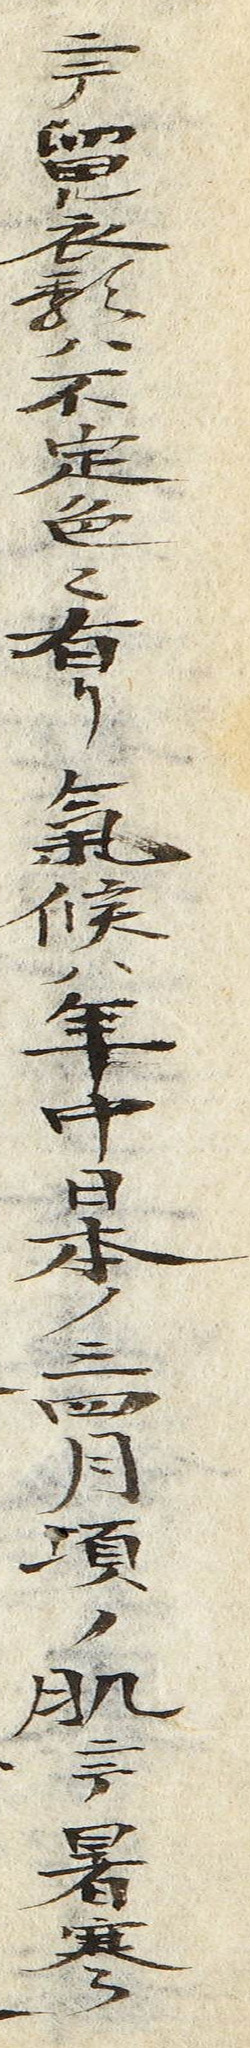ニテ留ル衣類ハ不定色々有リ気候ハ年中日本ノ三四月頃ノ肌ニテ暑寒
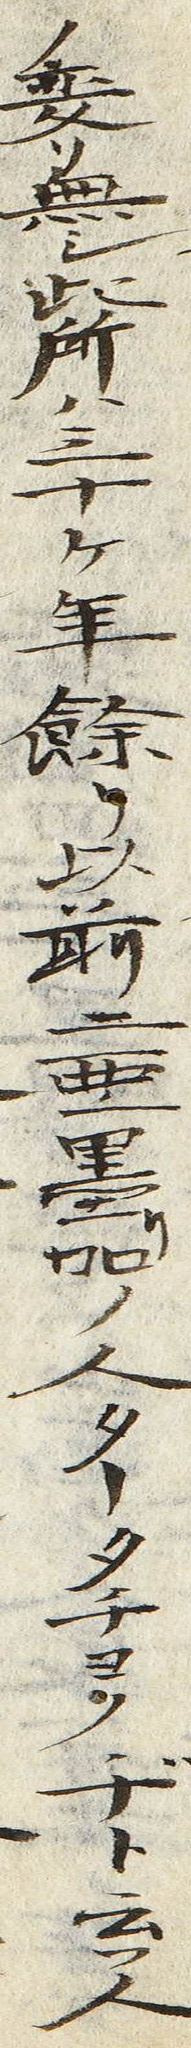ノ変リ無シ此所ハ三十ケ年余リ以前ニ亜墨リ加ノ人タータチヨノヂト云フ人
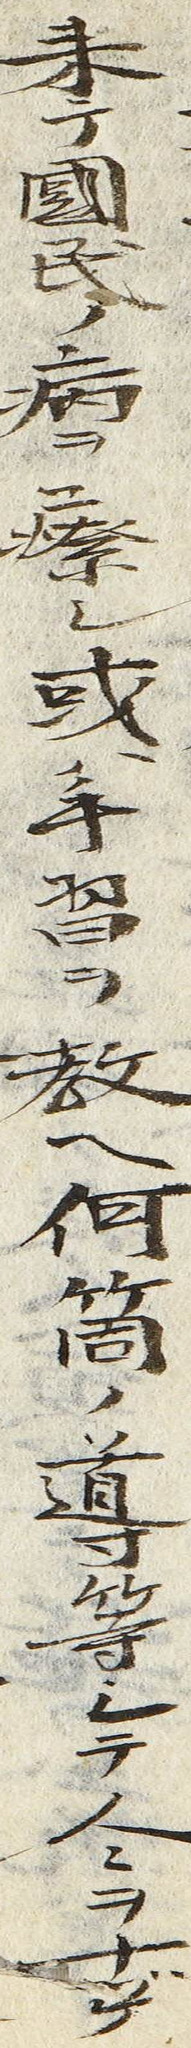来テ国民ノ病ヲ療シ或ハ手習ヲ教ヘ何筒ノ導等シテ人々ヲナヅケ
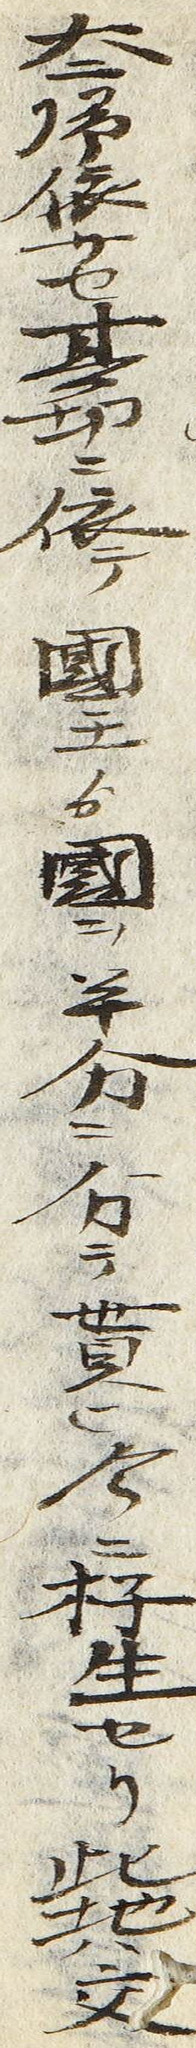大ニ帰依サセ其切ニ依テ国王ゟ国ヲ半分ニ分テ貰ヒ今ニ存生セリ此地ハ交
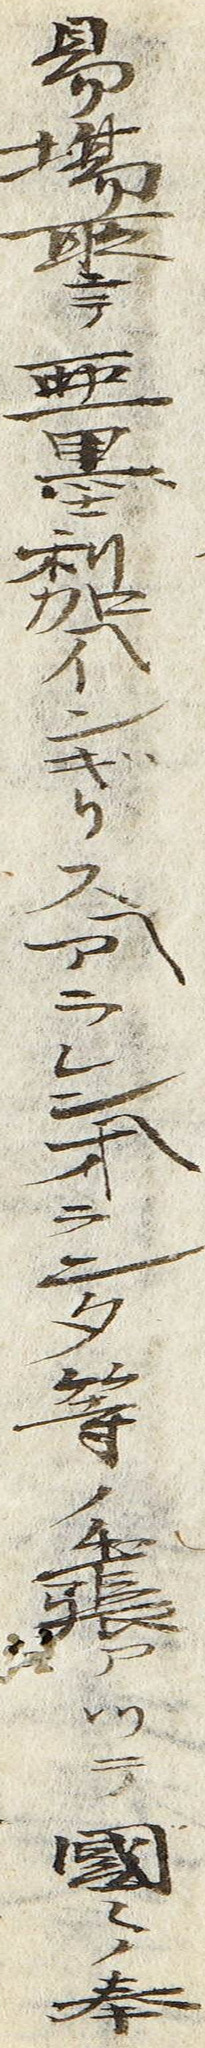易場所ニテ亜墨利加「インギリス「アラレン「オランタ等ノ出張アツテ国々ノ奉
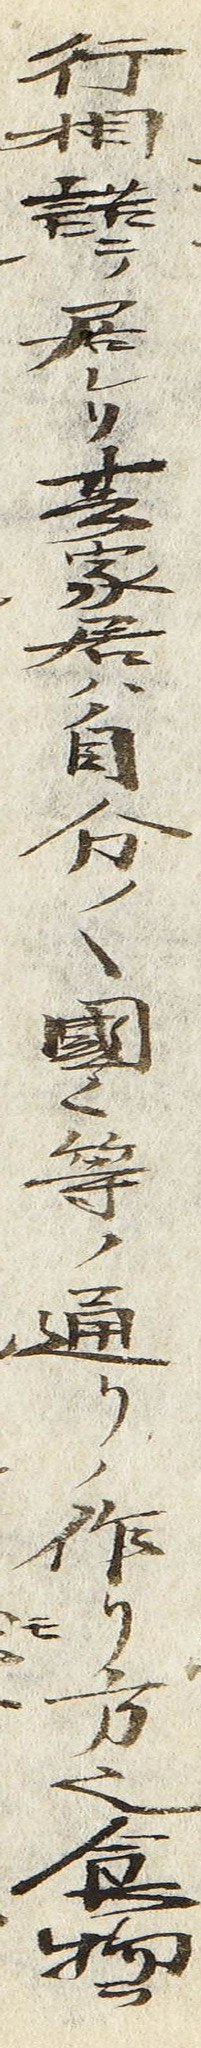行相詰テ居レリ其家居ハ自分〳〵国々等ノ通リノ作リ方也食物ヲ
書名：漂流記聞
